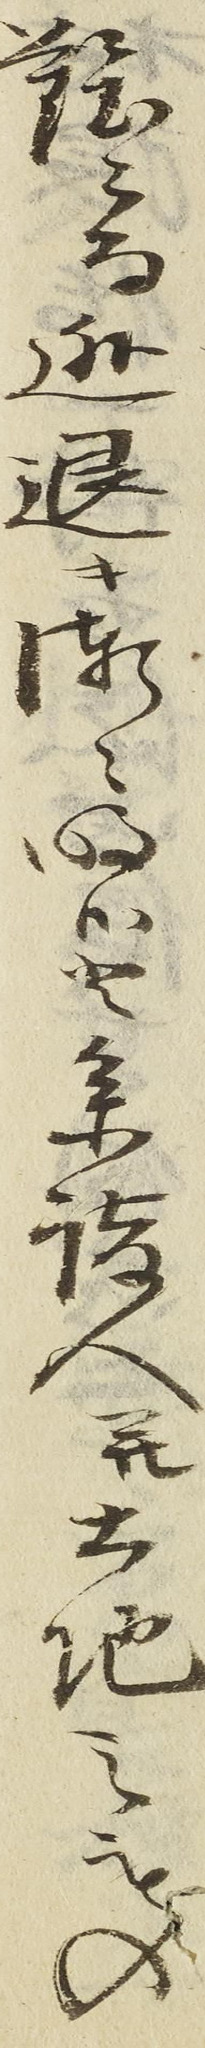難二而逃退キ漸々明候由参詣人并土地のもの
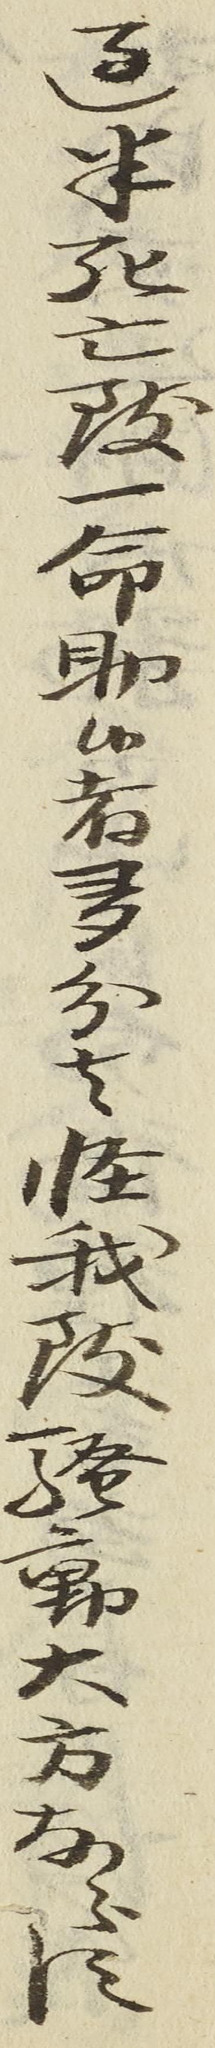過半死亡致一命助候者多分は怪我致騒動大方ならす
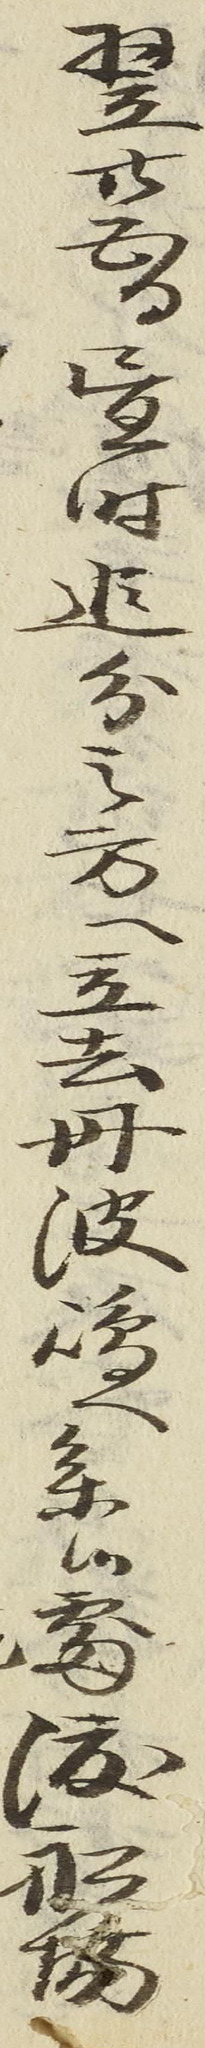翌廿五日昼時追分之方へ立去丹波嶋へ参候処渡船場
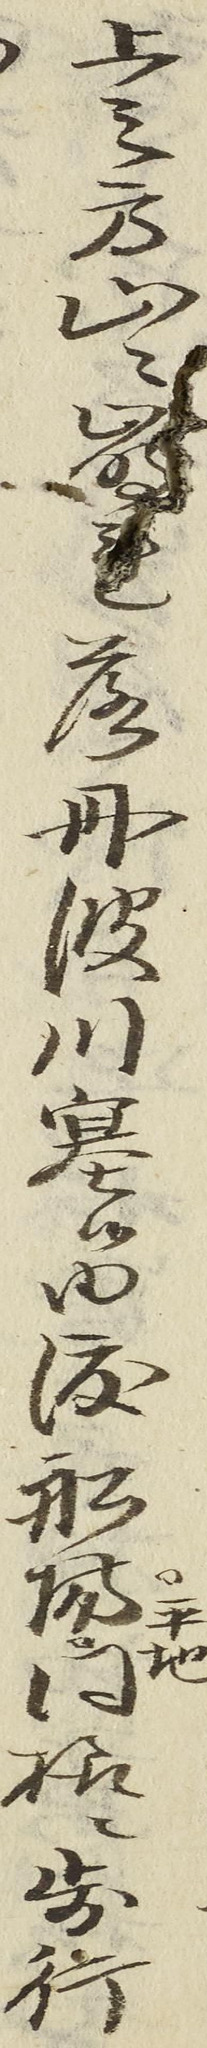上之方山々崩れ落丹波川塞候由渡船場平地同様二歩行
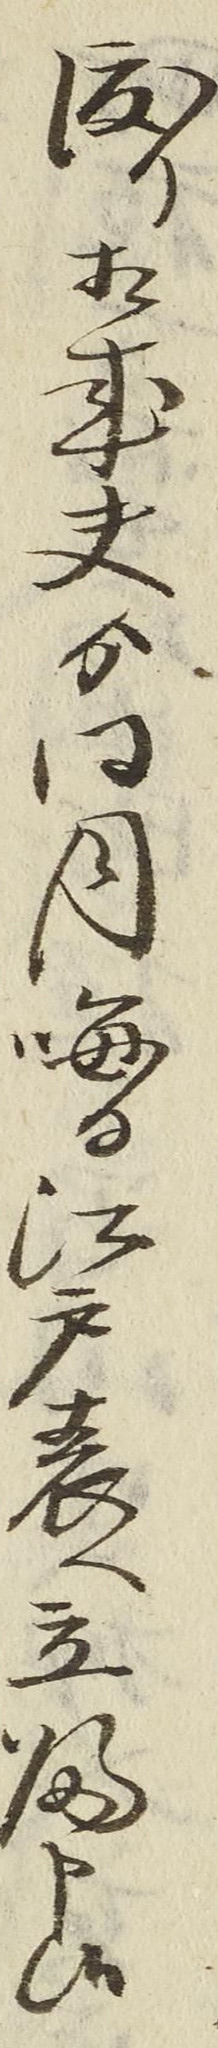渡り相成夫ゟ同月晦日江戸表へ立帰申候
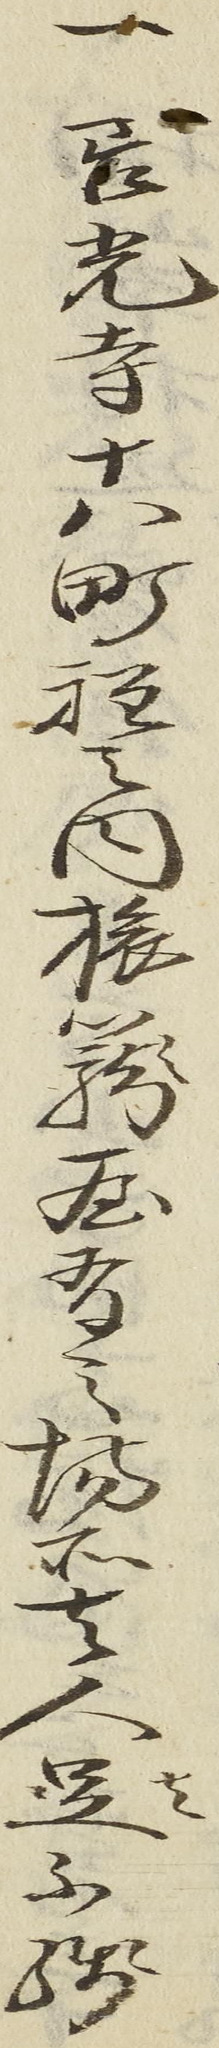一善光寺十八町程之内旅籠屋有之場所壱人足不残
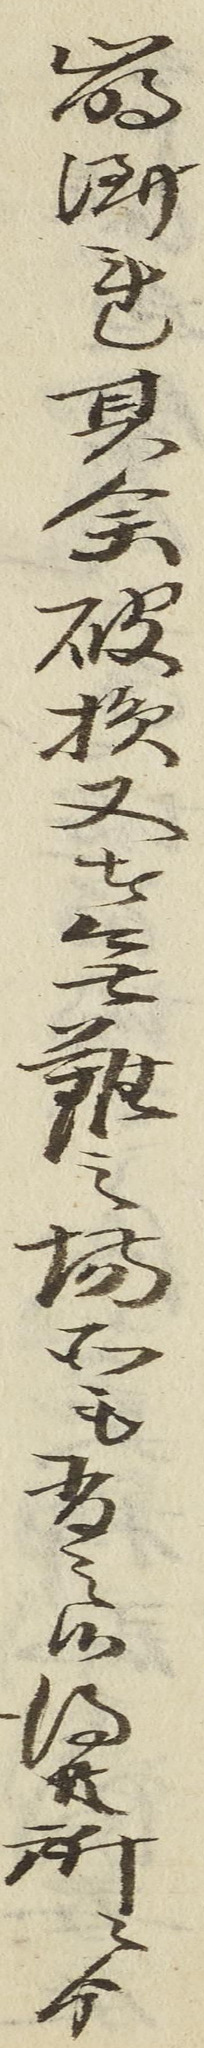崩倒れ其余破損又は無難之場所も有之候得共所々ゟ
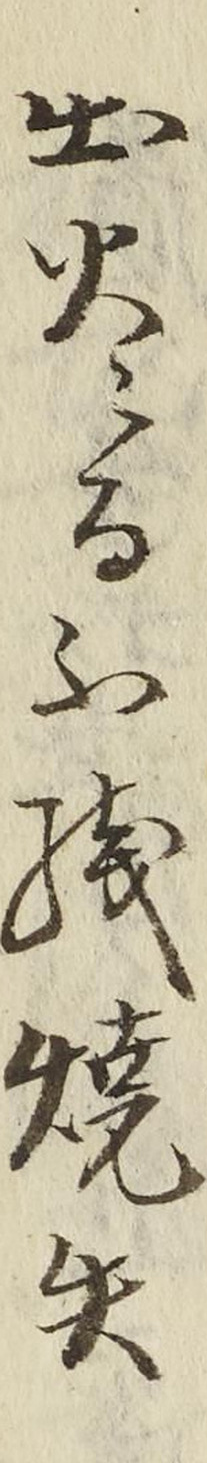出火二而不残焼失
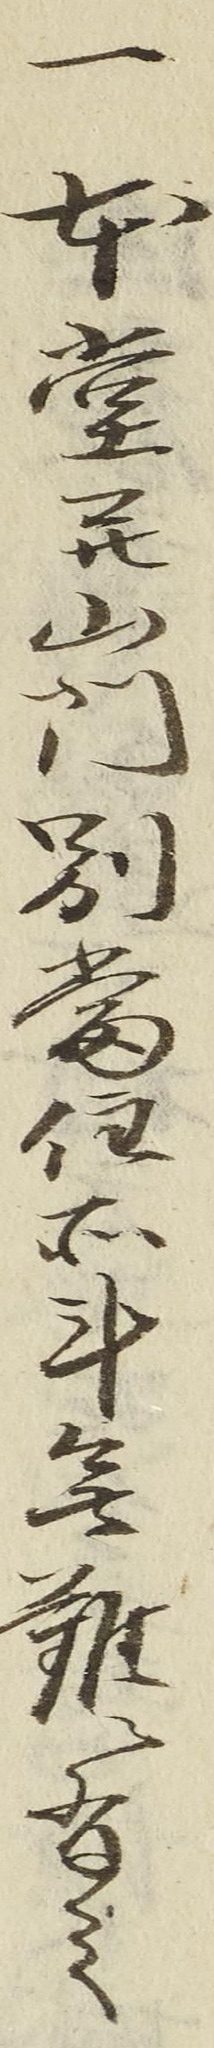一本堂并山門別当住所斗無難二有之
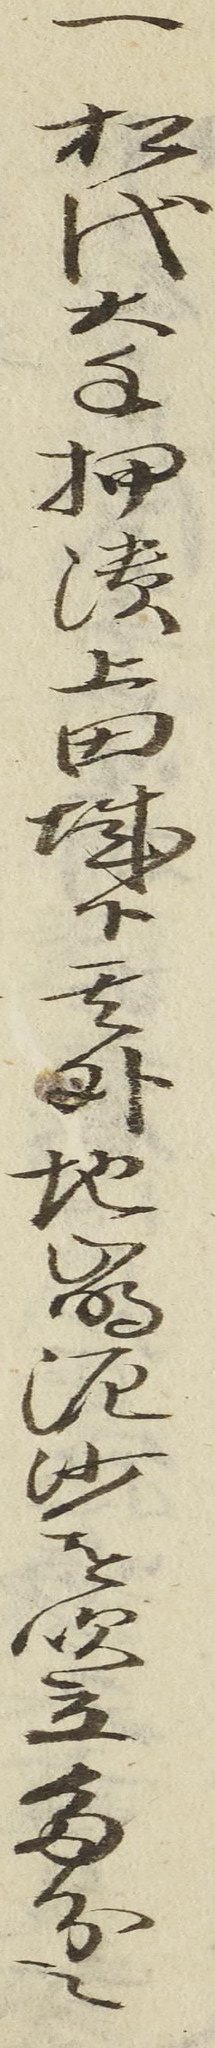一松代大手押潰上田城下其外地崩泥砂を吹立多分之
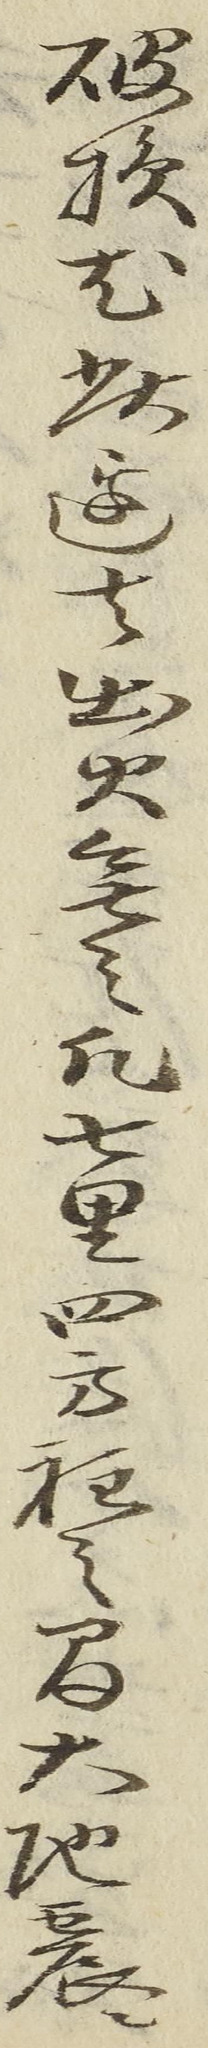破損尤も此辺は出火無之凡七里四方程之間大地震二
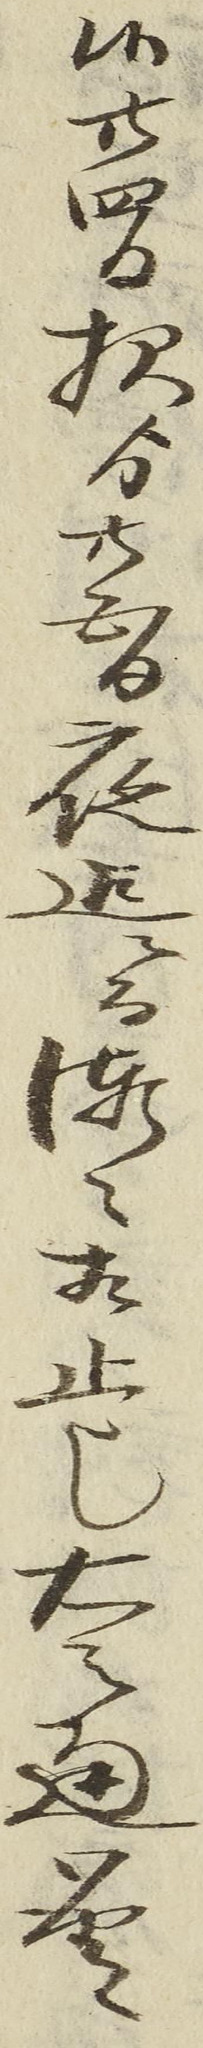候廿四日夜ゟ廿五日夜迄二而漸々相止申候右之通御座候
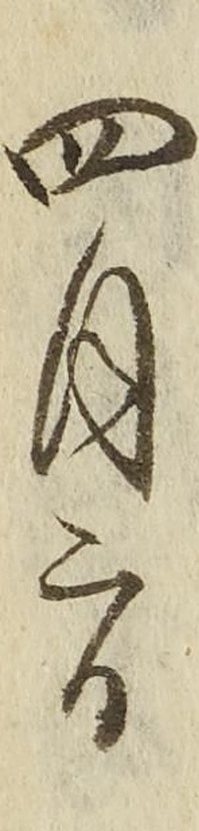四月二日

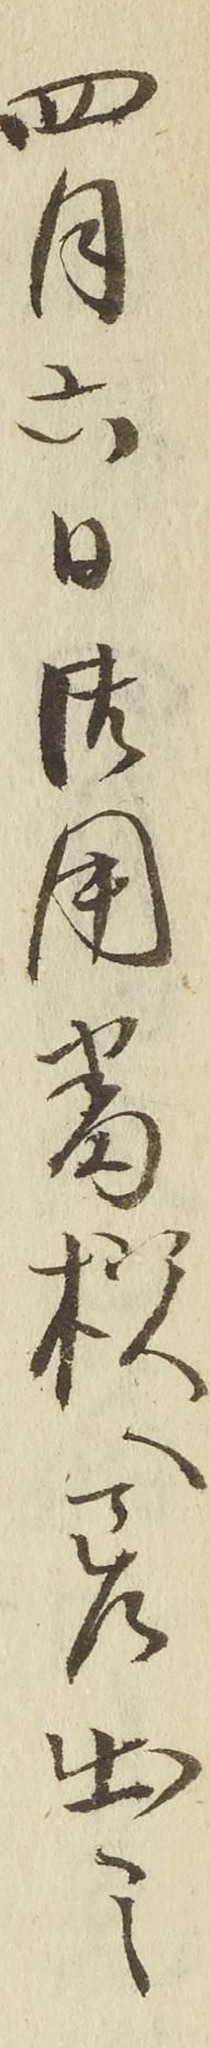四月六日御用番様へ差出之
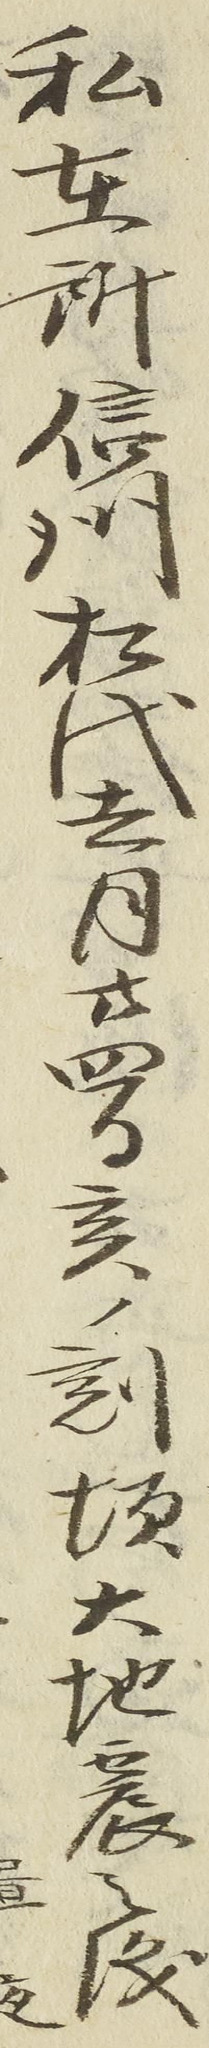私在所信州松代去月廿四日亥ノ刻比大地震之儀
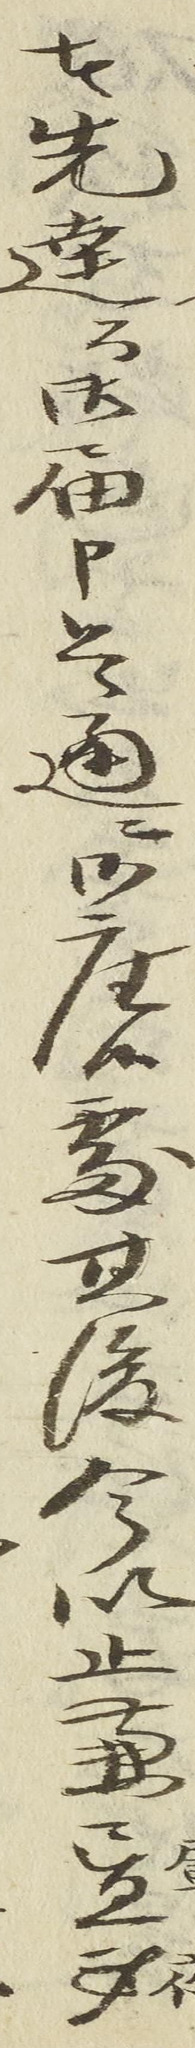は先達而御届申上候通二御座候処其後今以止兼昼夜
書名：信濃國大地震記　乾
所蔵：東京大学地震研究所図書室 Earthquake Research Institute Library, The University of Tokyo, JAPAN
